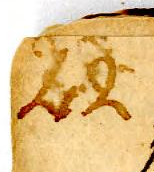42
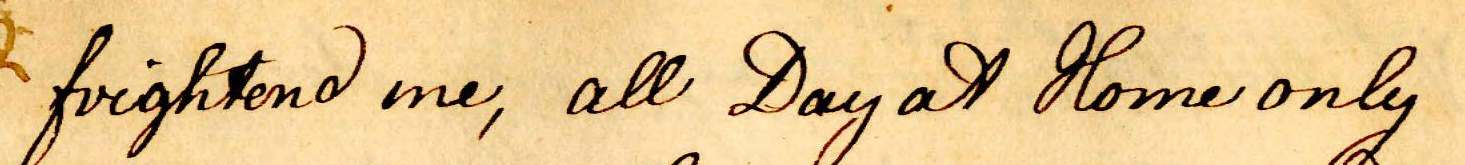frightend me, all Day at Home only
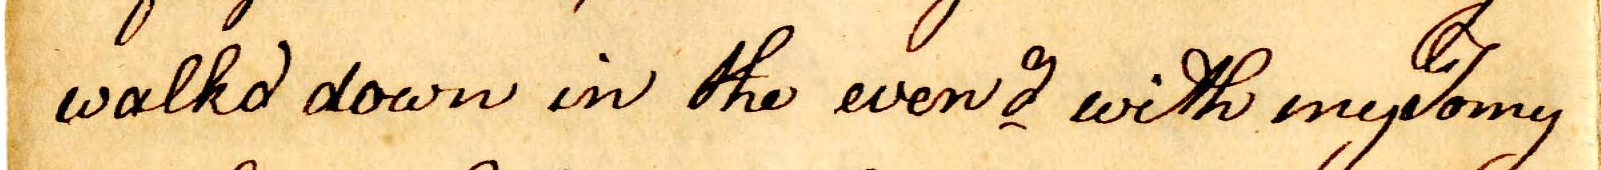walkd down in the even^g with my Tomy
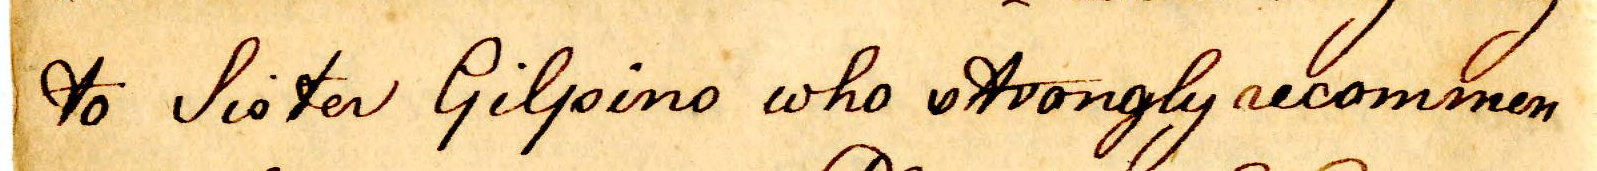to Sister Gilpins who strongly recommen
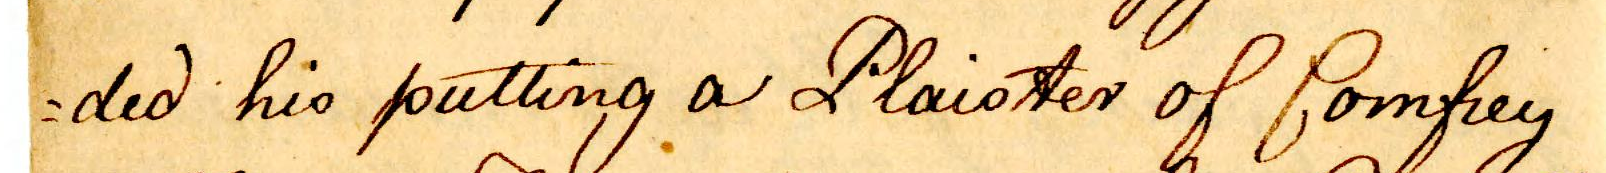-ded his putting a Plaistter of Comfrey
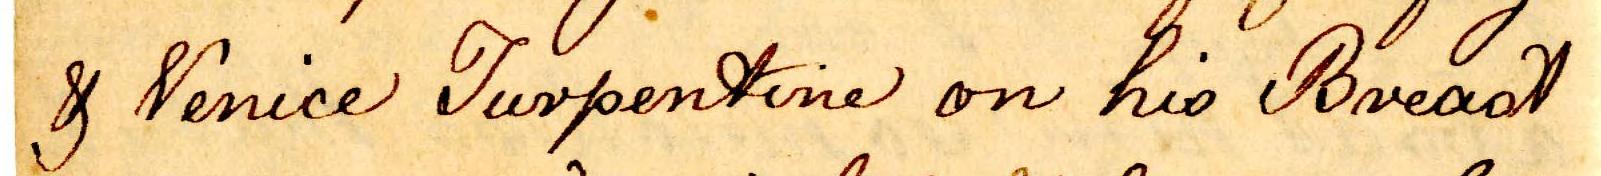& Venice Turpentine on his Breast
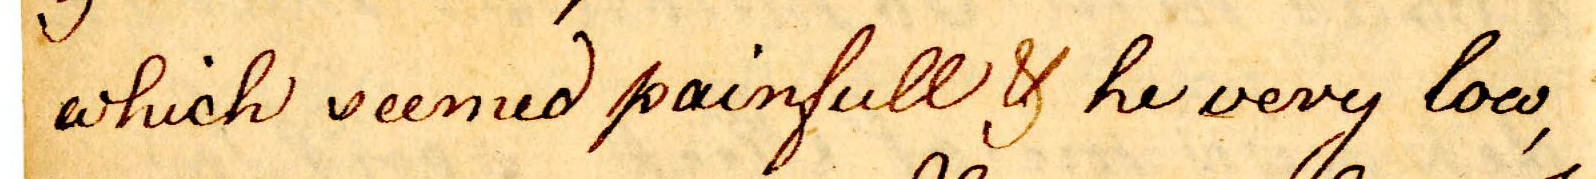which seemed painfull & he very low,
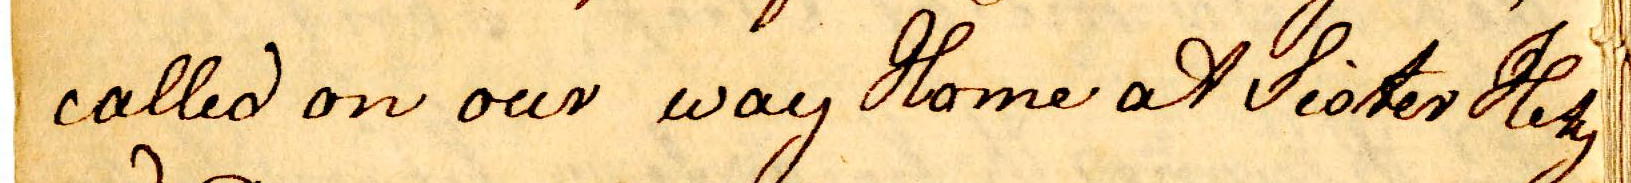called on our way Home at Sister Hety
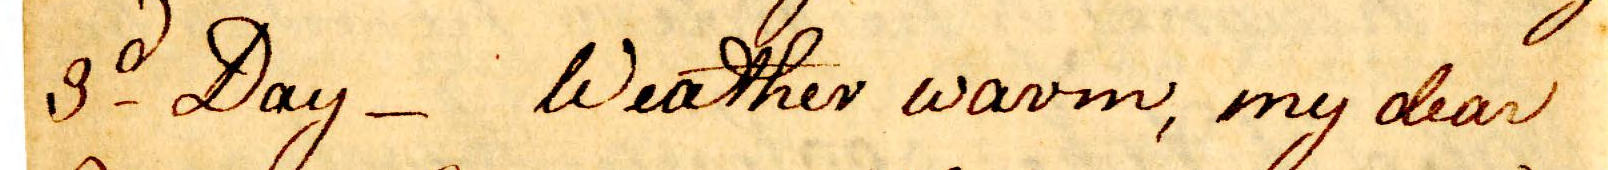3^d Day- Weather warm, my dear
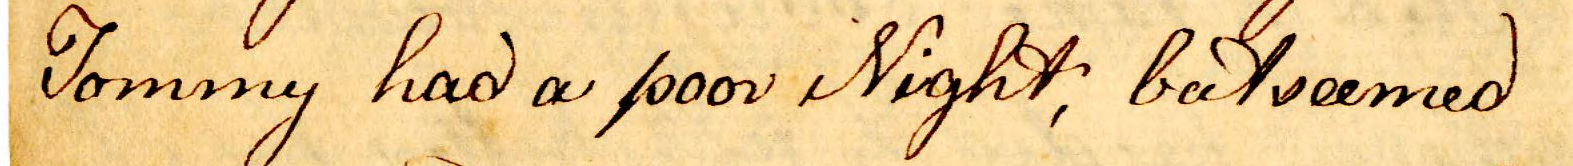Tommy had a poor Night, but seemed
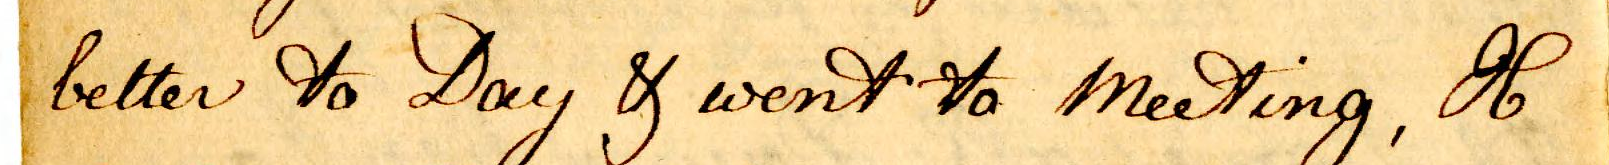better to Day & went to Meeting, H
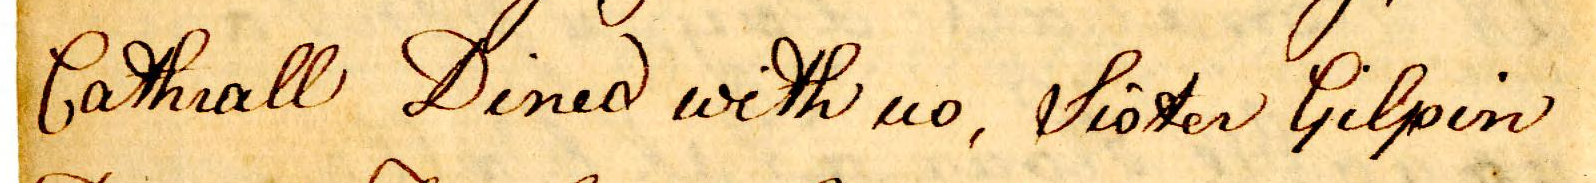Cathrall Dined with us, Sister Gilpin
